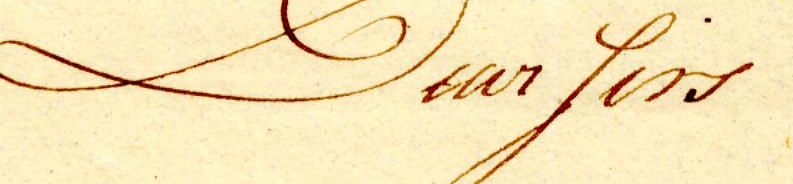Dear Sirs
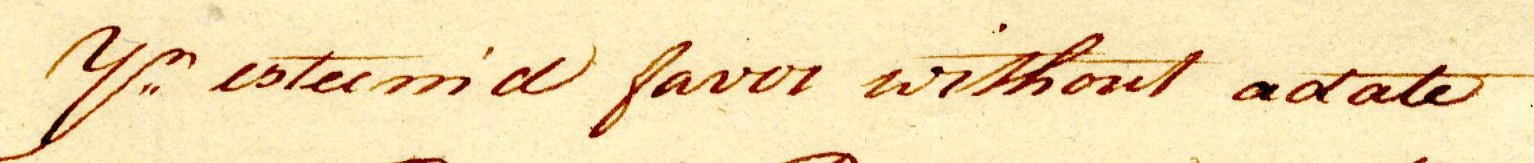Y^r. esteem'd favor without a date
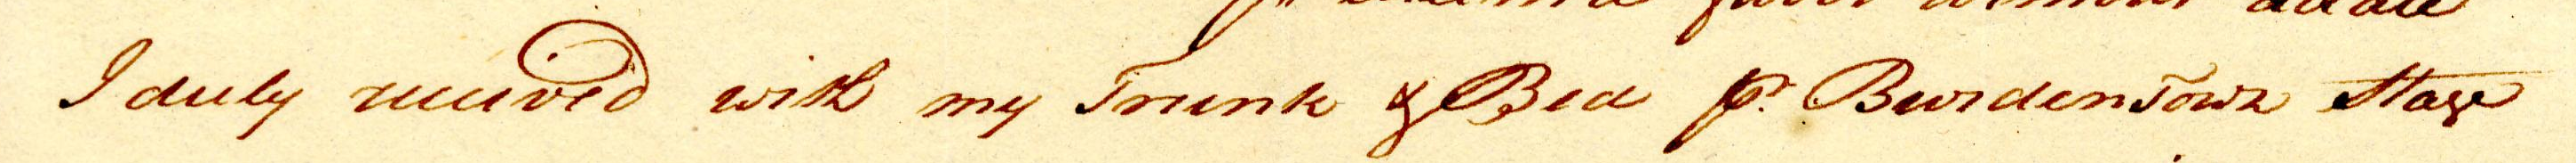I duly received with my Trunk & Bed p^t. Burden Town Stage
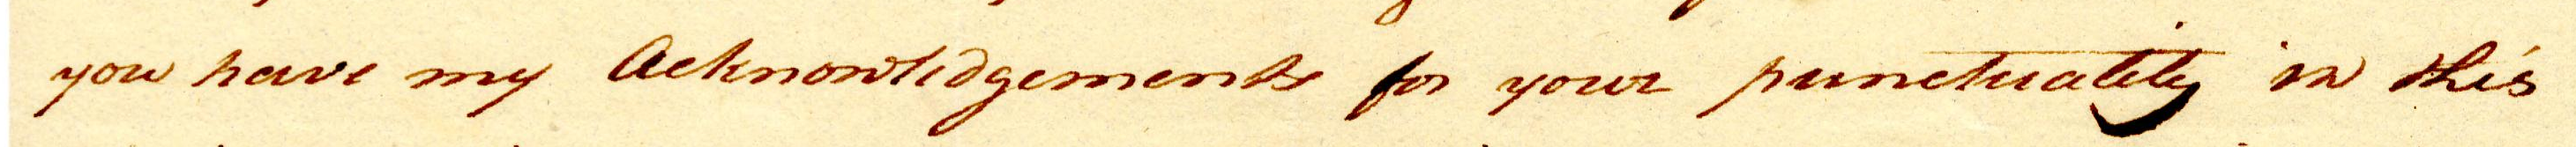you have my Acknowlidgements for your punctuality in this
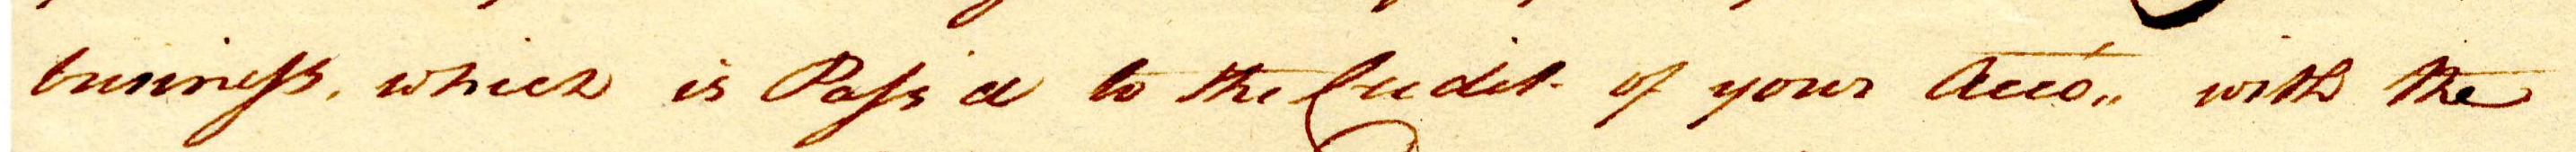business, which is Pass'd to the Credit of your acco^t. with the
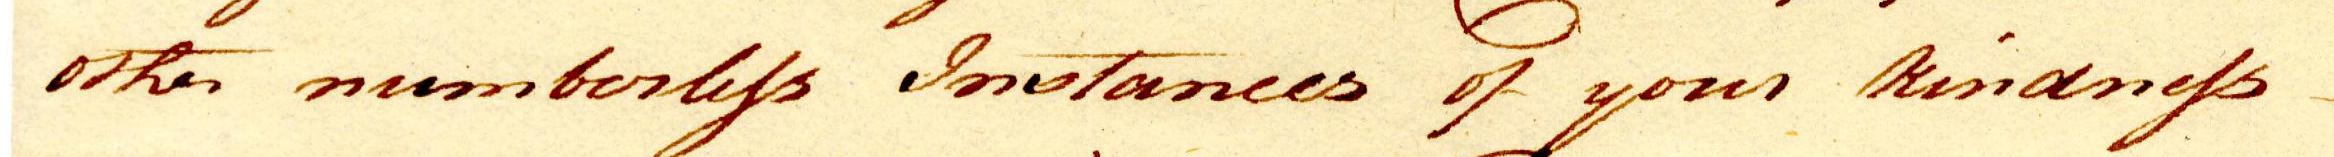other numberless Instances of your kindness
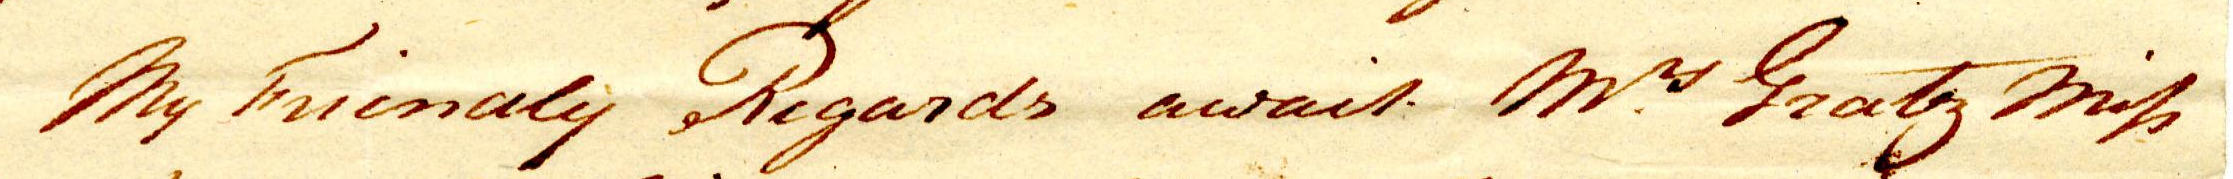My Friendly Regards await M^rs. Gratz miss
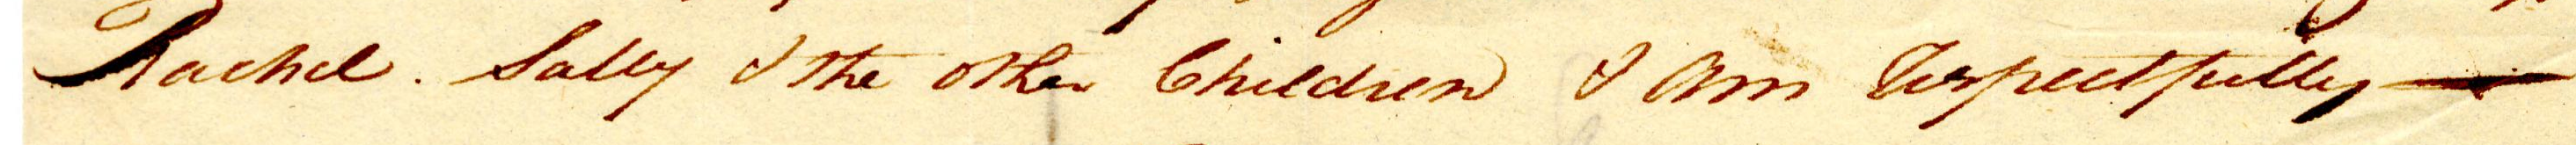Rachel. Sally & the other Children & am Respectfully-
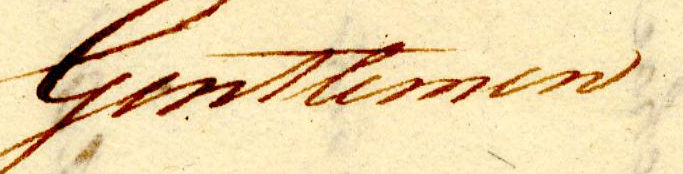Gentlmen
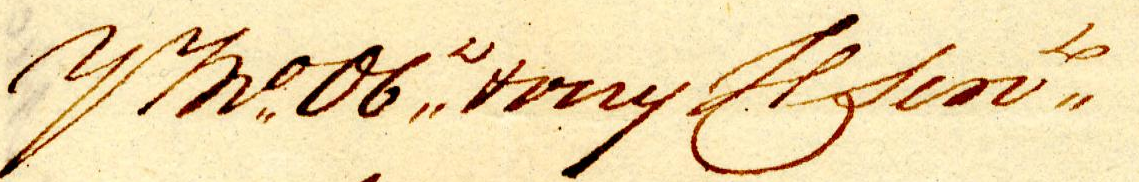Y^r m^o Ob^t. very H Serv^t
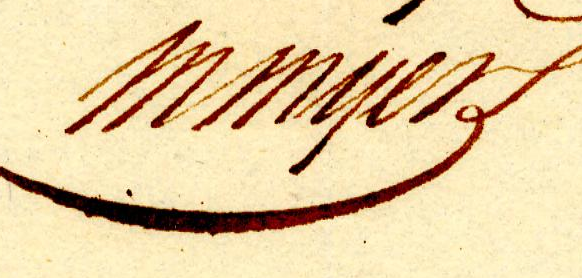M Myers
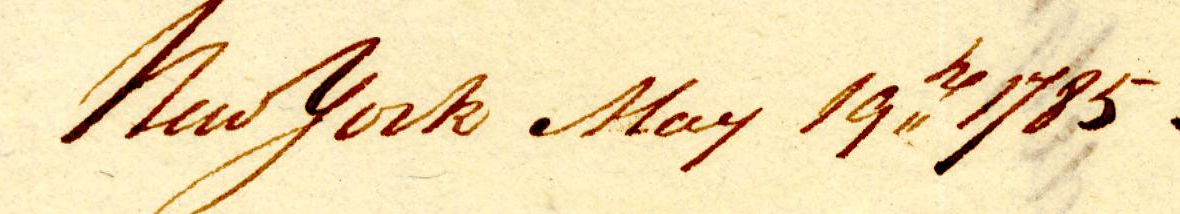New York May 19^th 1785
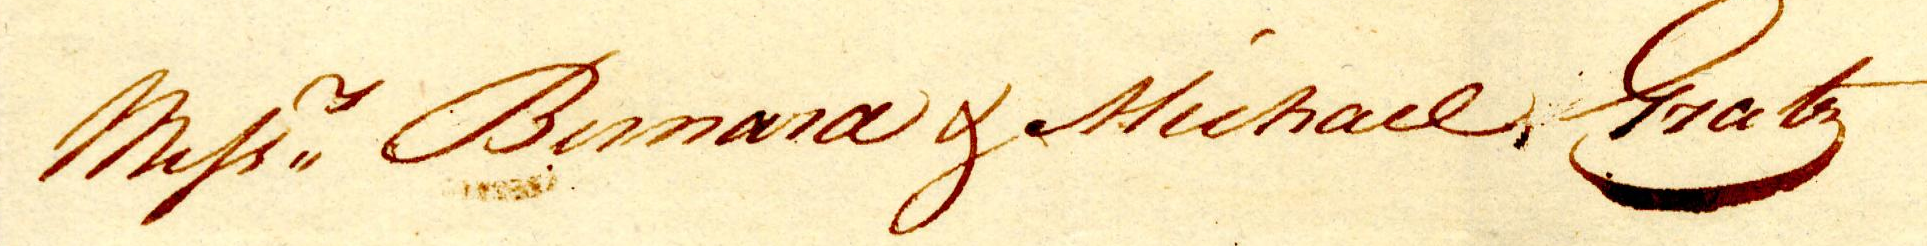Mess^s. Bernard & Michael Gratz
